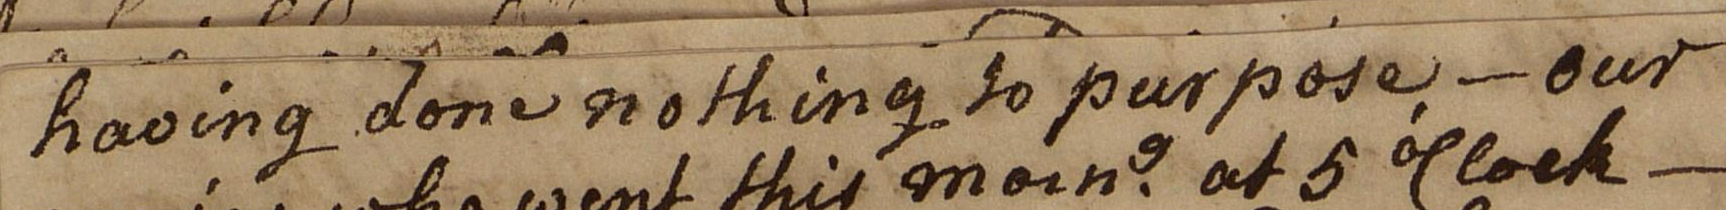having done nothing to purpose- our
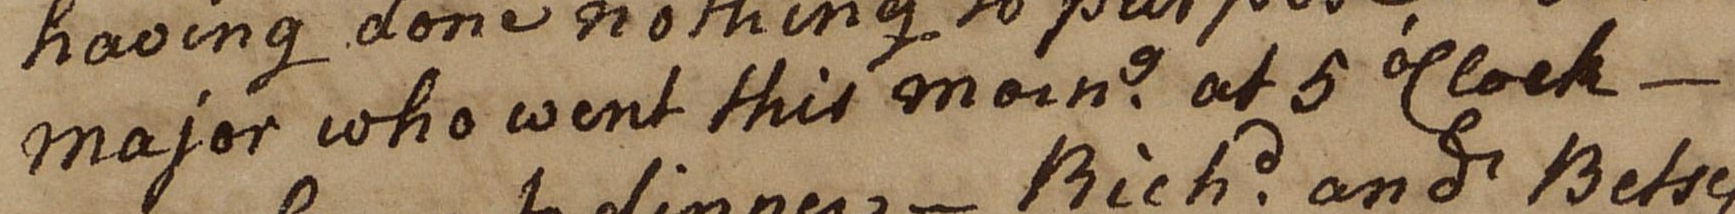major who went this morn^g. at 5 ^o Clock-
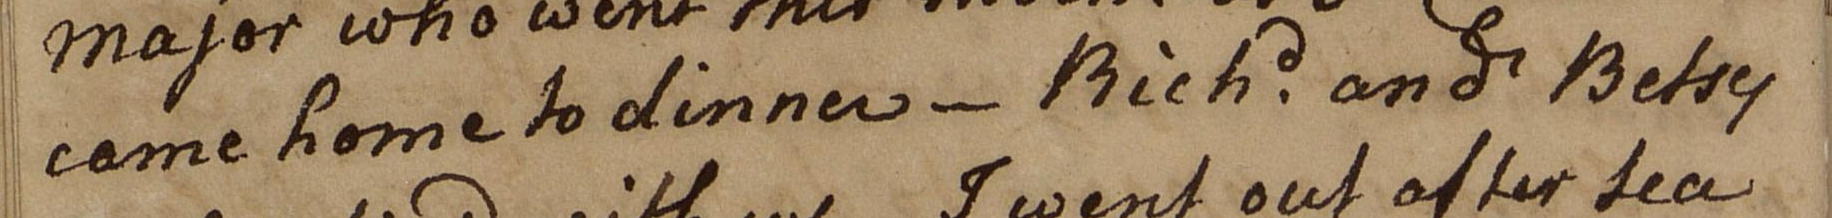came home to dinner- Rich^d. and Betsy
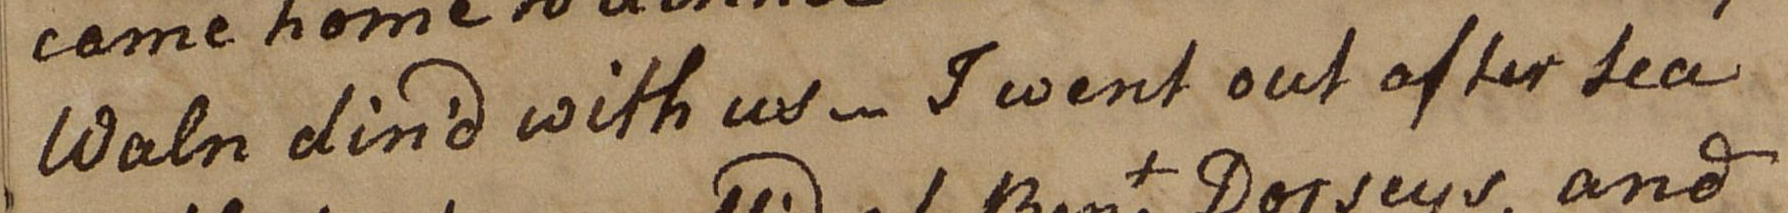Waln din'd with us- I went out after tea
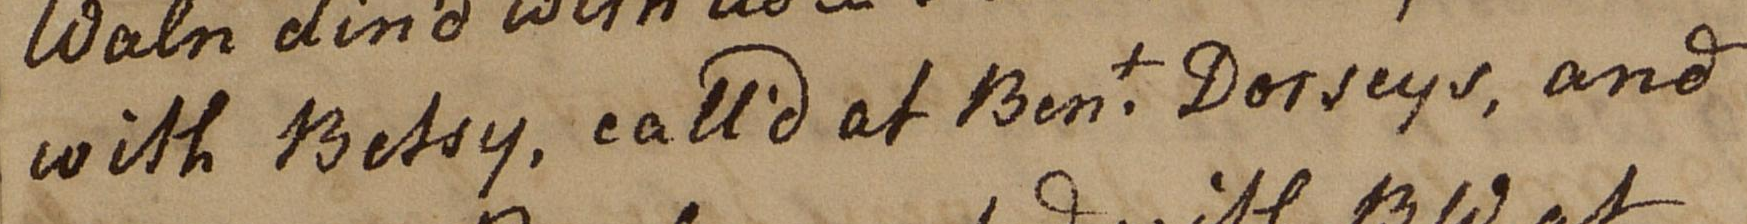with Betsy, call'd at Ben^t. Dorseys, and
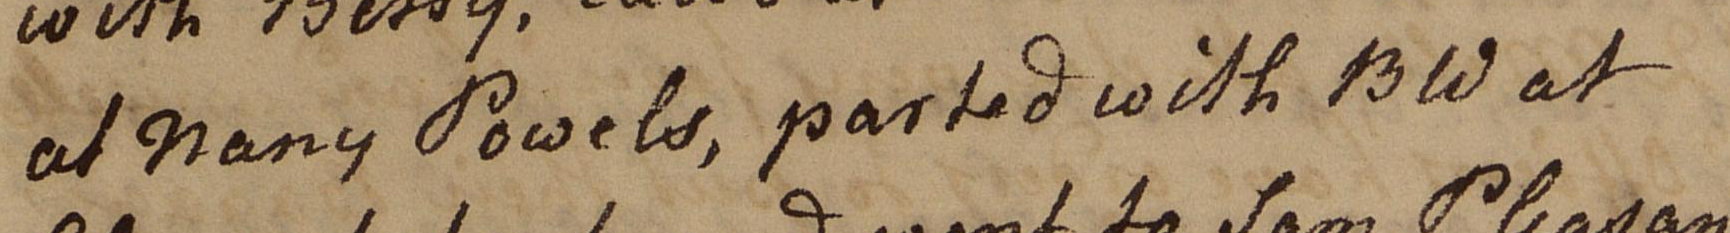at Nany Powels, parted with BW at
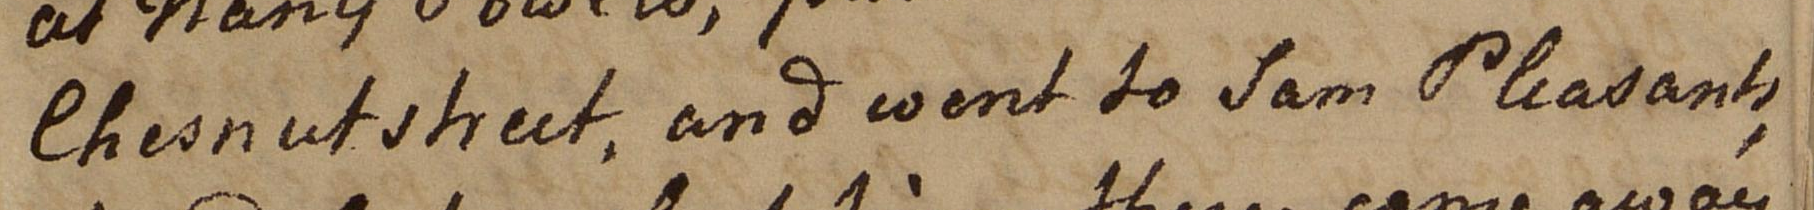Chesnutstreet, and went to Sam Pleasants,
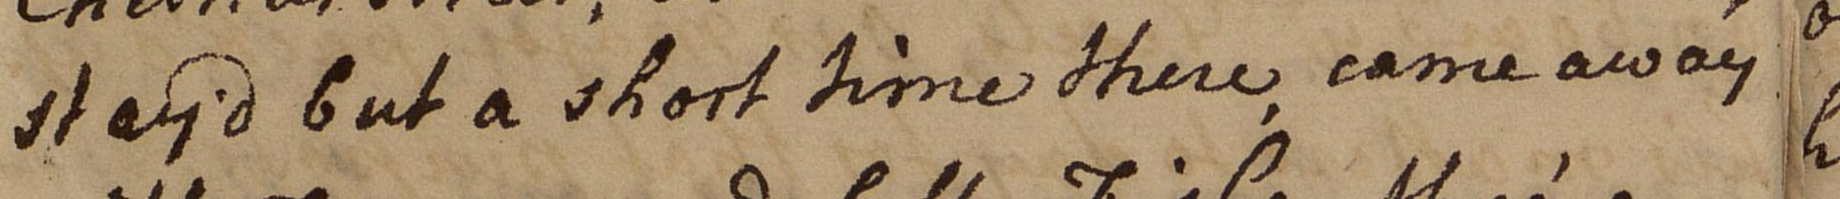stay'd but a short time there, came away
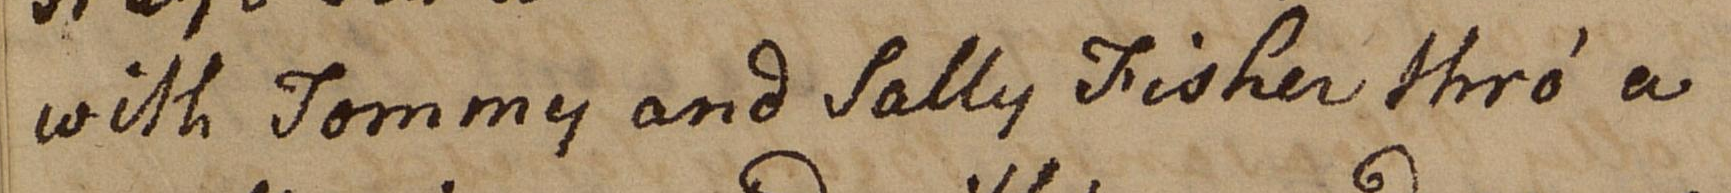with Tommy and Sally Fisher thro' a
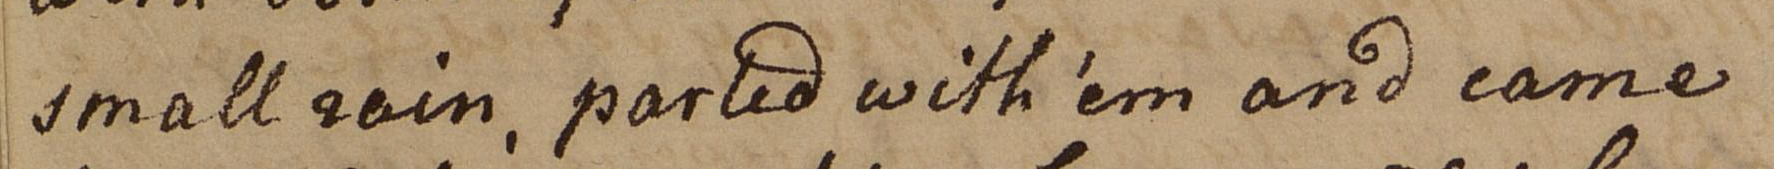small rain, parted with 'em and came
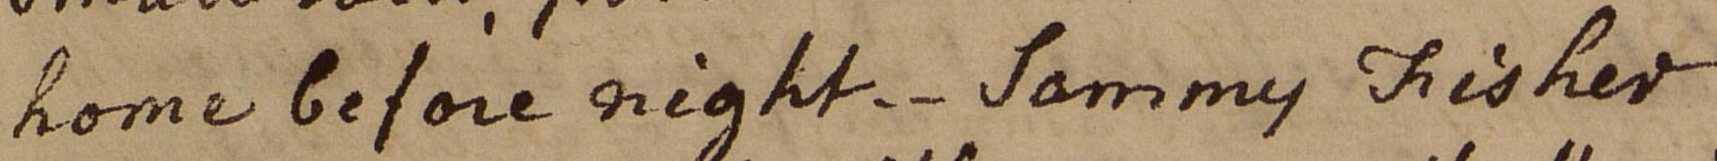home before night-- Sammy Fisher
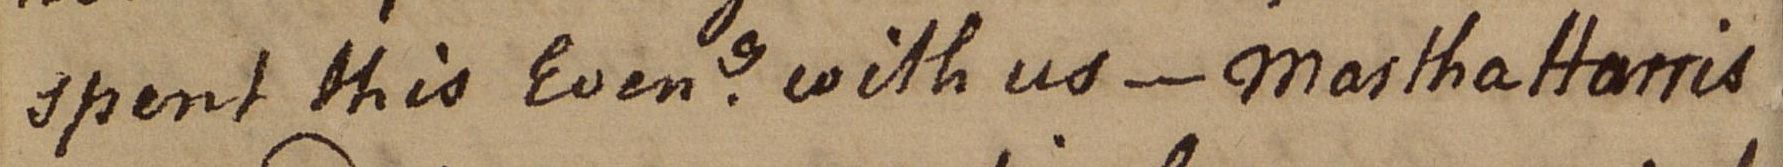spent this Even^g. with us- Martha Harris
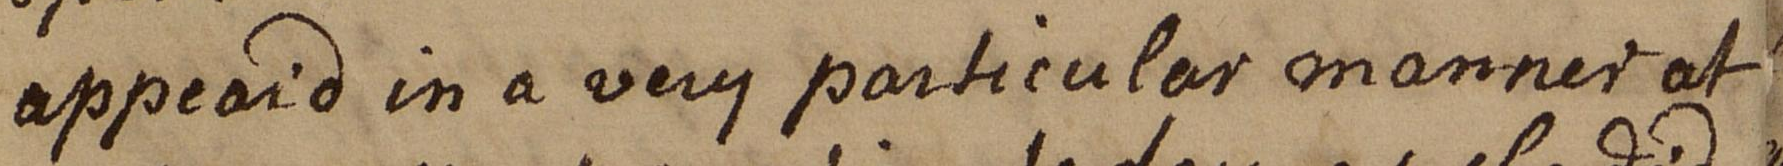appear'd in a very particular manner at
